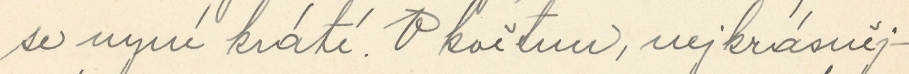se nyní krátí. V květnu, nejkrásněj-
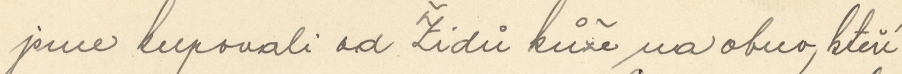jsme kupovali od Židů kůže na obuv, kteří
